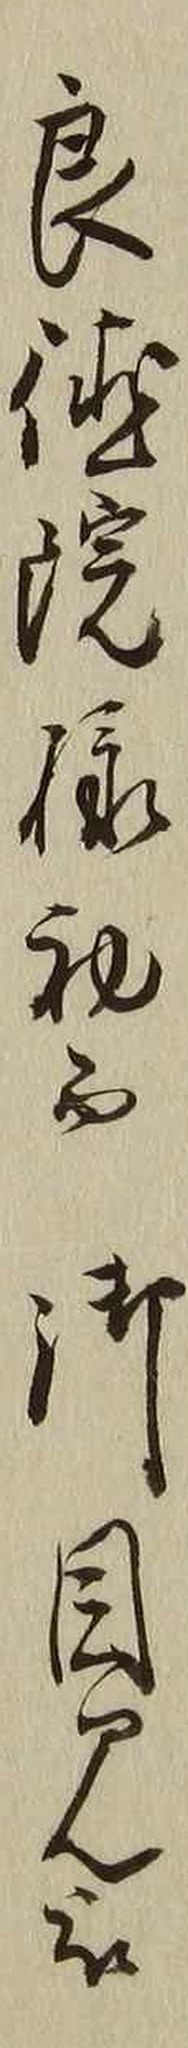良徳院様初而御目見被
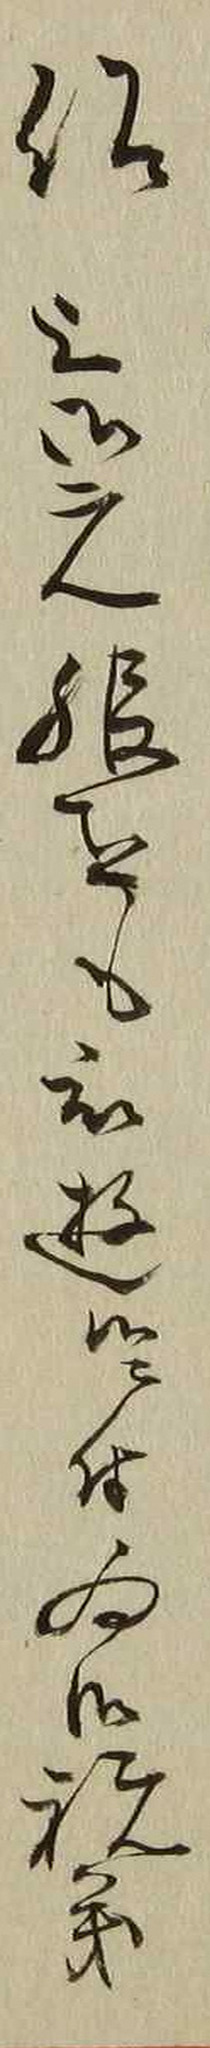仰上御元服をも被遊候ニ付為御祝義
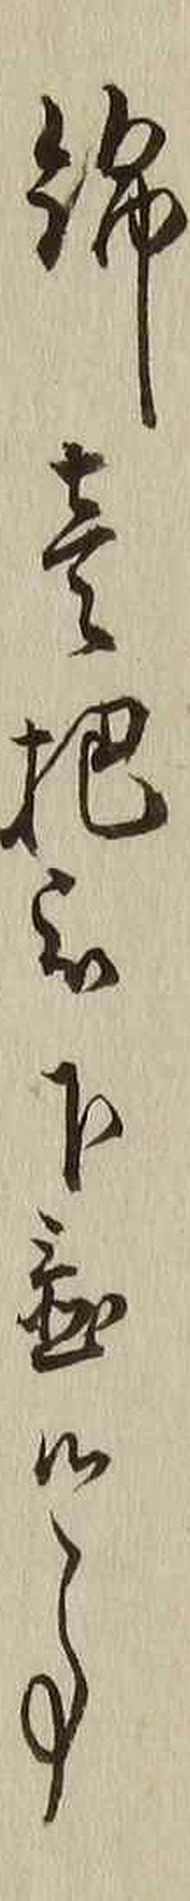綿壱把被下置候事
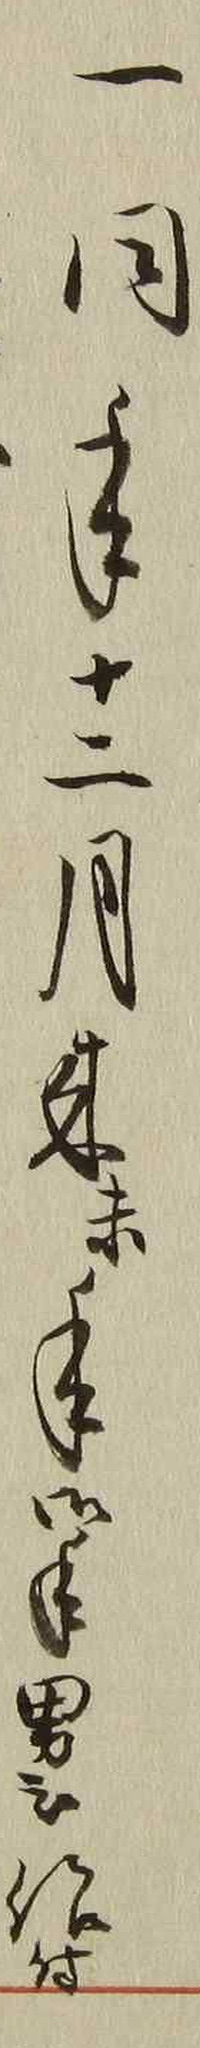一同年十二月来未年御年男被仰付
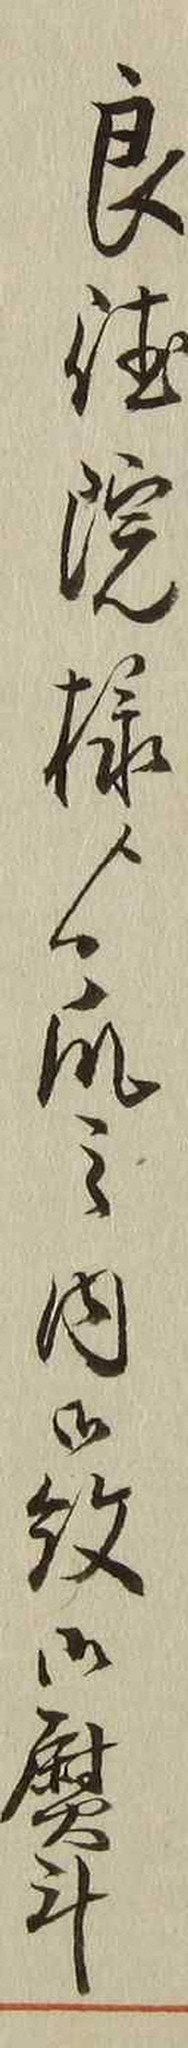良徳院様ゟ瓜之内御紋御熨斗
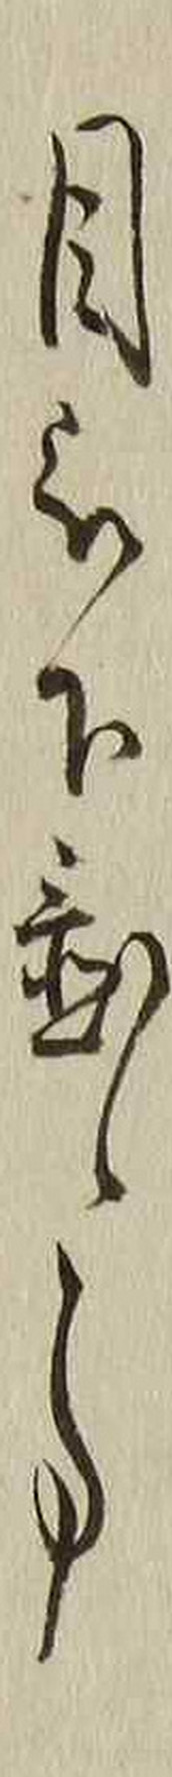目被下置候事
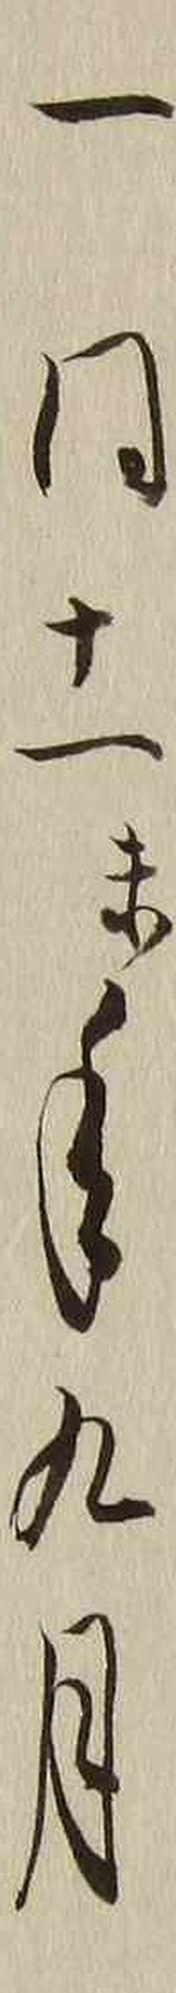一同十一未年九月
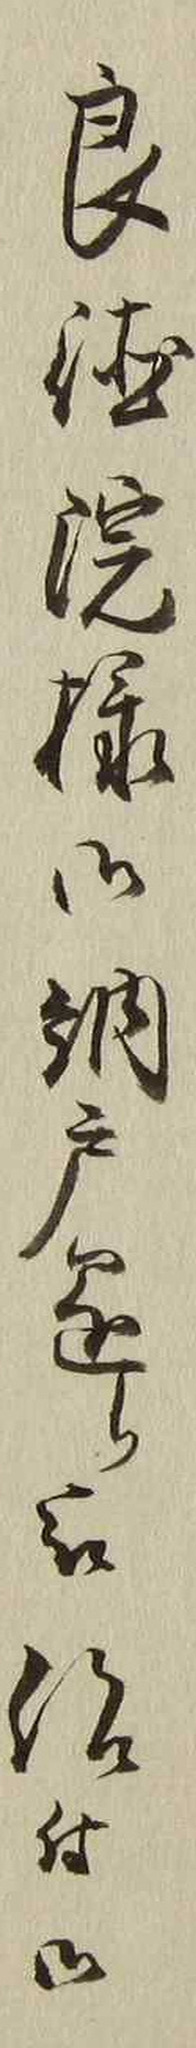良徳院様御納戸懸り被仰付御
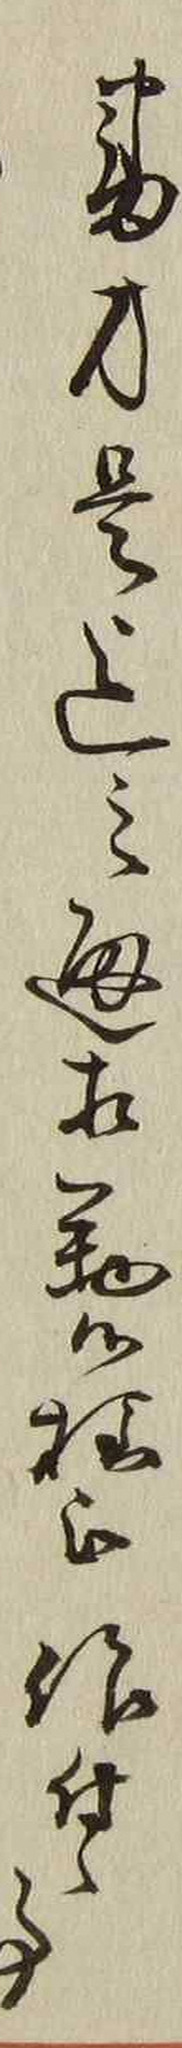番方是迄之通相勤候様被仰付候事
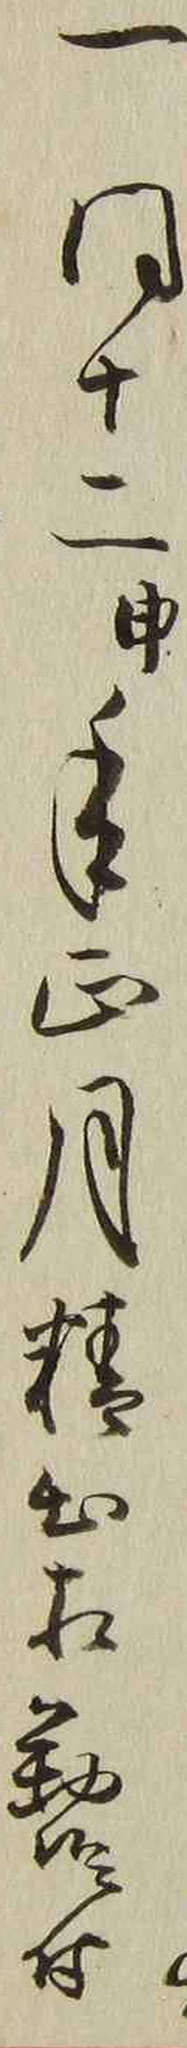一同十二申年正月精出相勤候ニ付
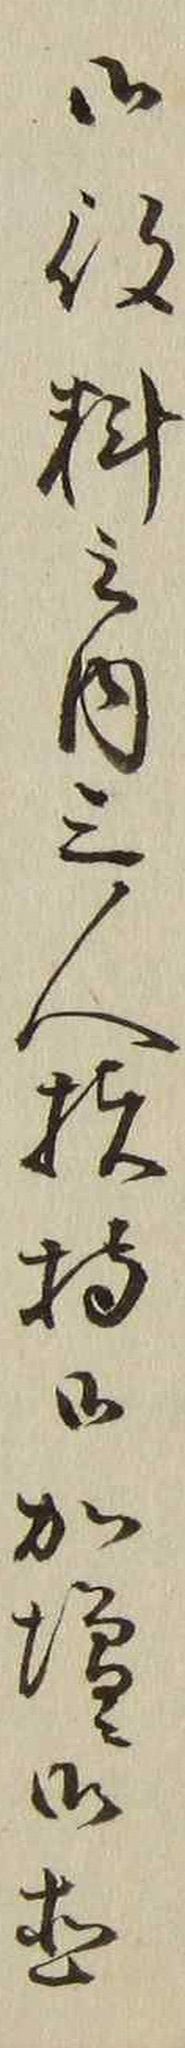御役料之内三人扶持御加増ニ御直
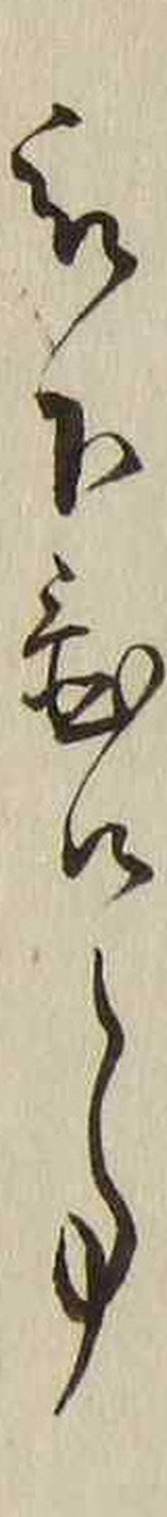被下置候事

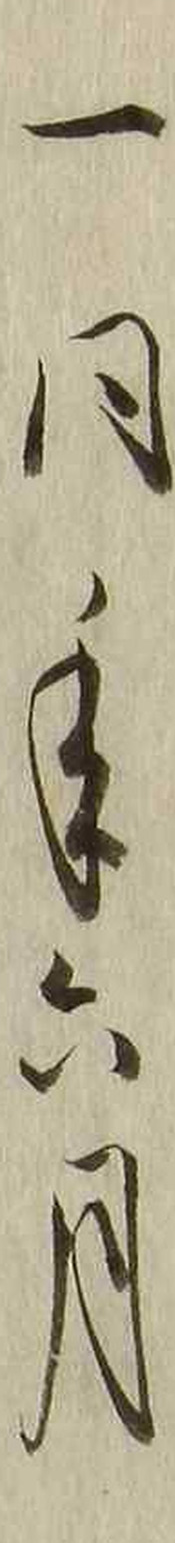一同年六月
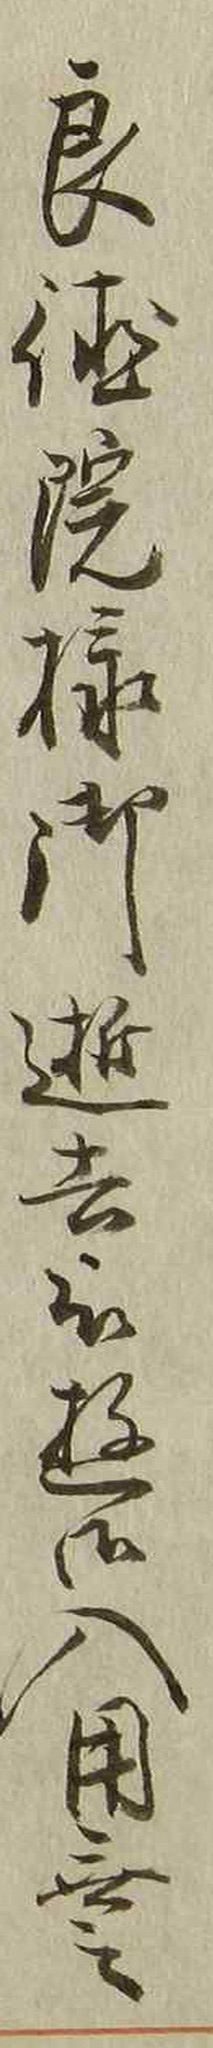良徳院様御逝去被遊御入用無之
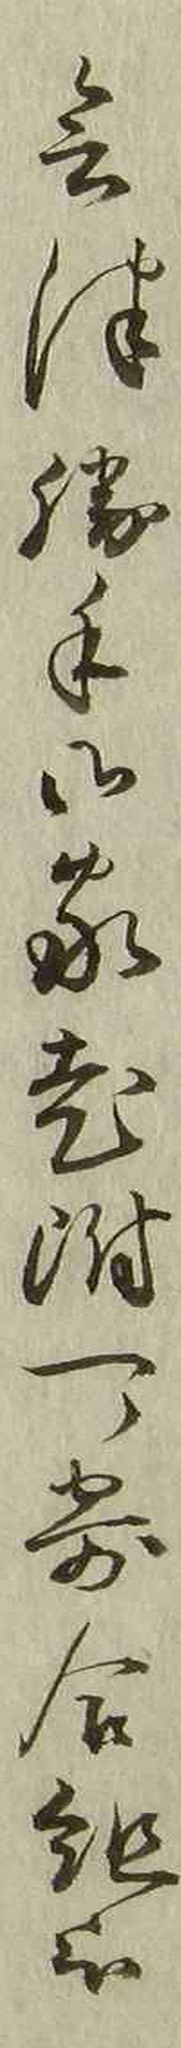会津勝手御家老附一ノ寄合組被
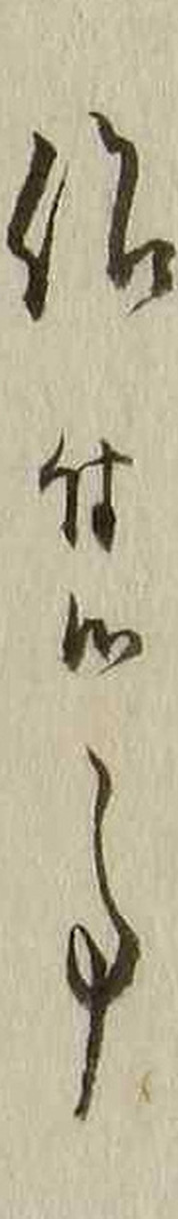仰付候事
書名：諸士系譜　巻之57　ほ之部4
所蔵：会津若松市立会津図書館
